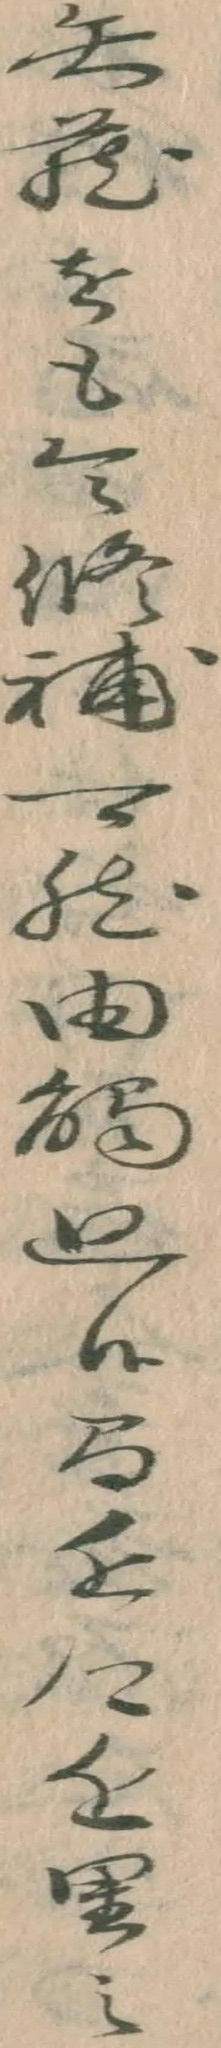矢蔵をも令修補可然由触廻候間近郷近里之
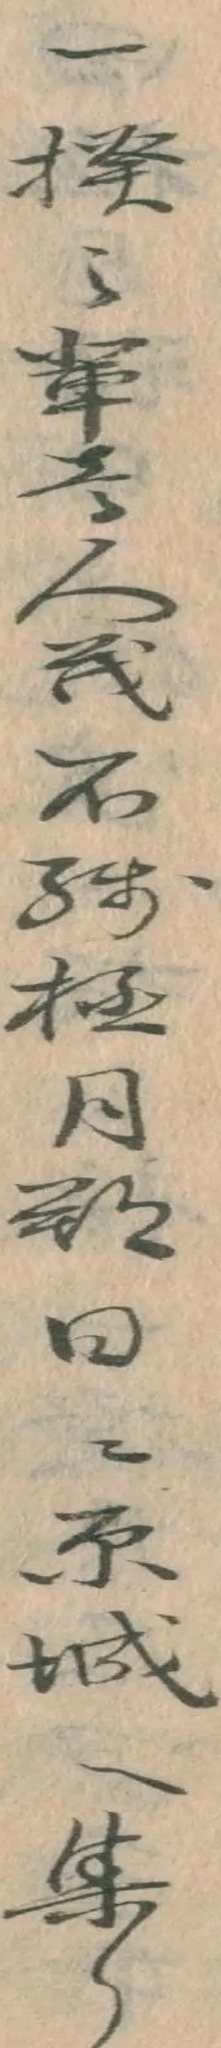一揆之輩壱人も不残極月朔日に原城へ集り
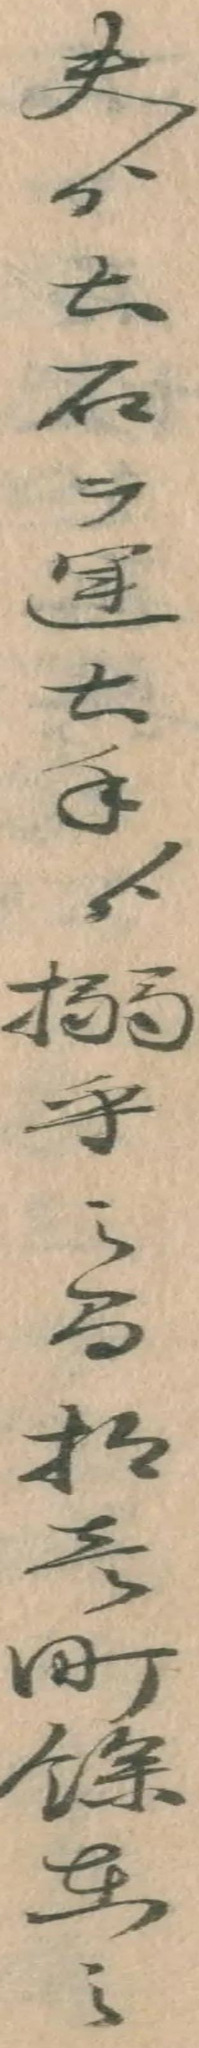夫ゟ大石を運大手ゟ搦乎之間拾壱町余在之

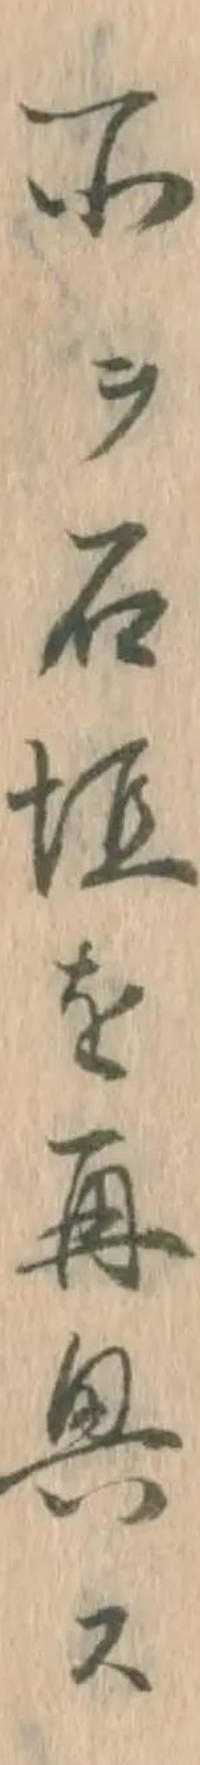所を石垣を再興す
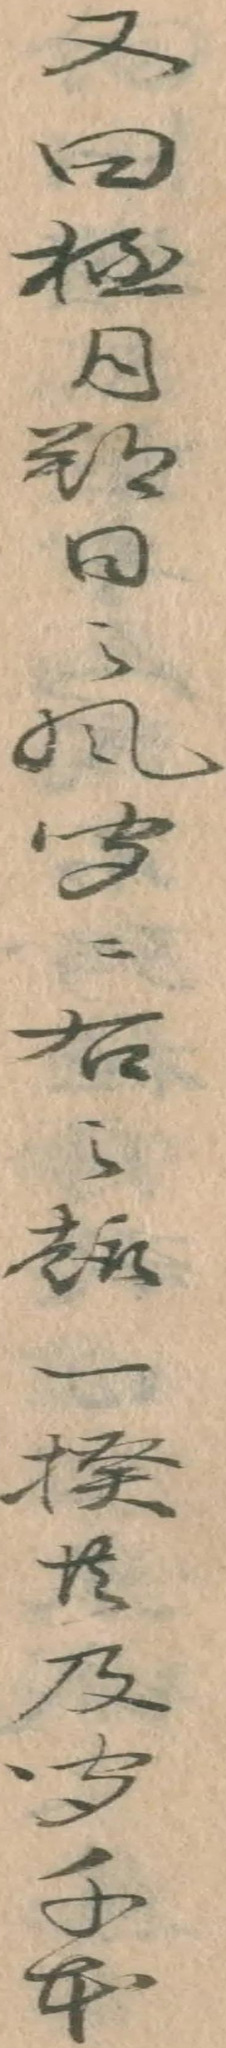又曰極月朔日之風聞に右之趣一揆共及聞千本
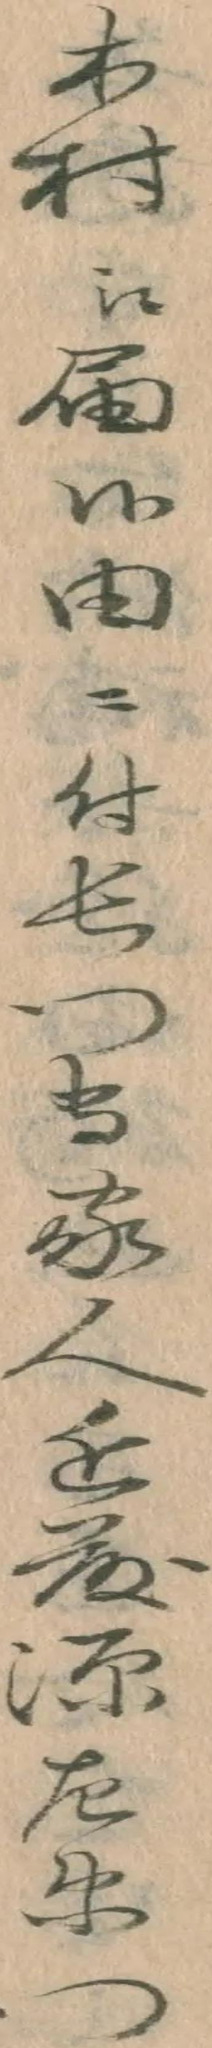木村江届候由に付長門守家人近藤源左衛門
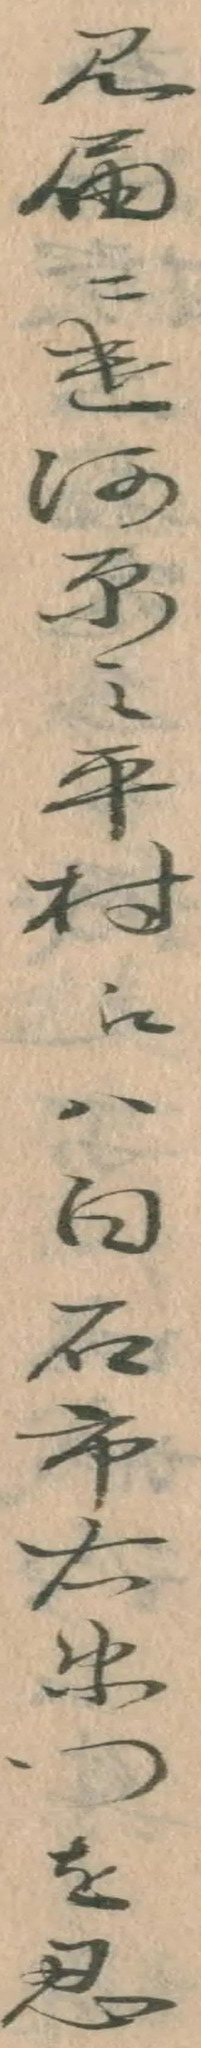見届に遣河原之平村江は白石市右衛門を忍
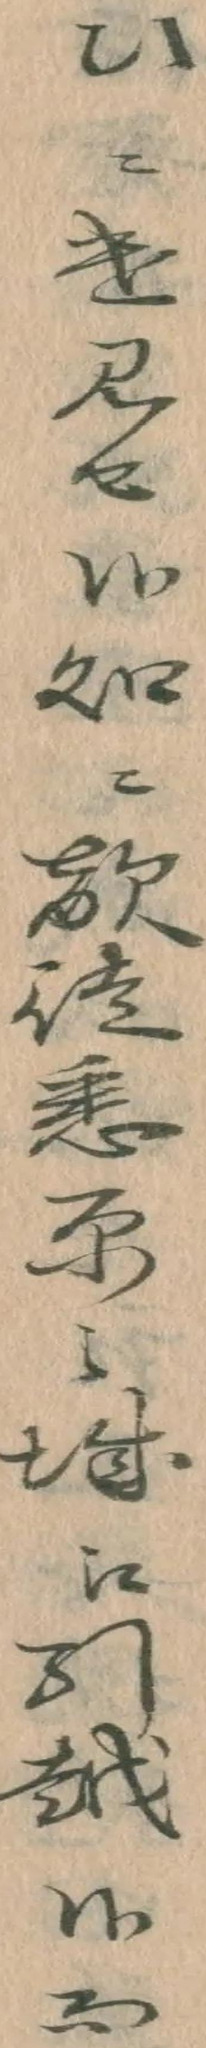ひに遣見せ候処に敵徒悉原之城江引越候而
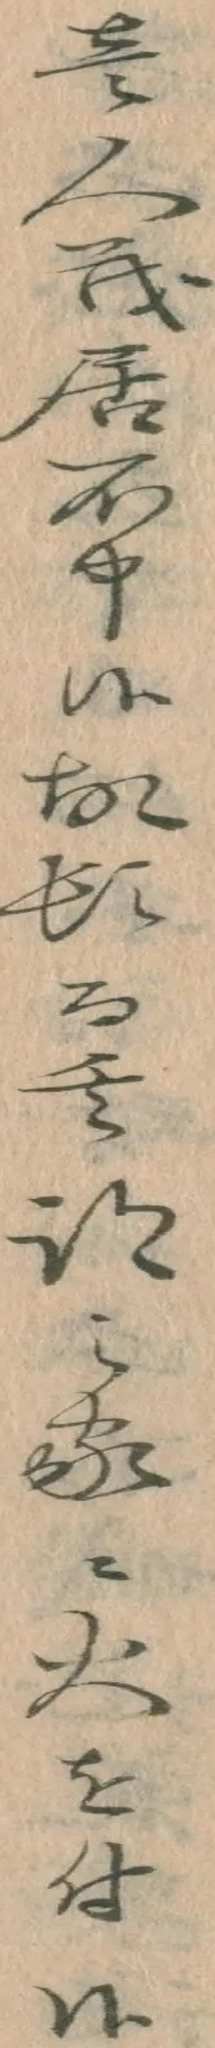壱人も居不申候故頓而其跡之家に火を付候
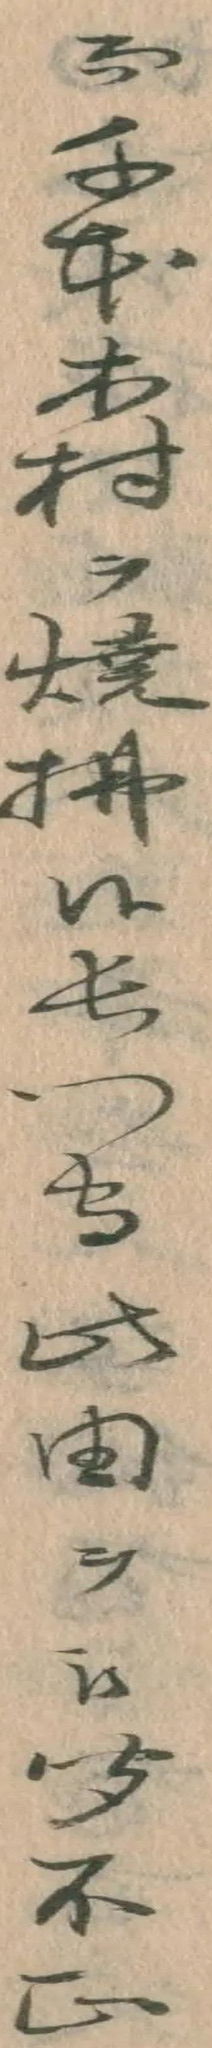而千本木村を焼払候長門守此由を被聞不正
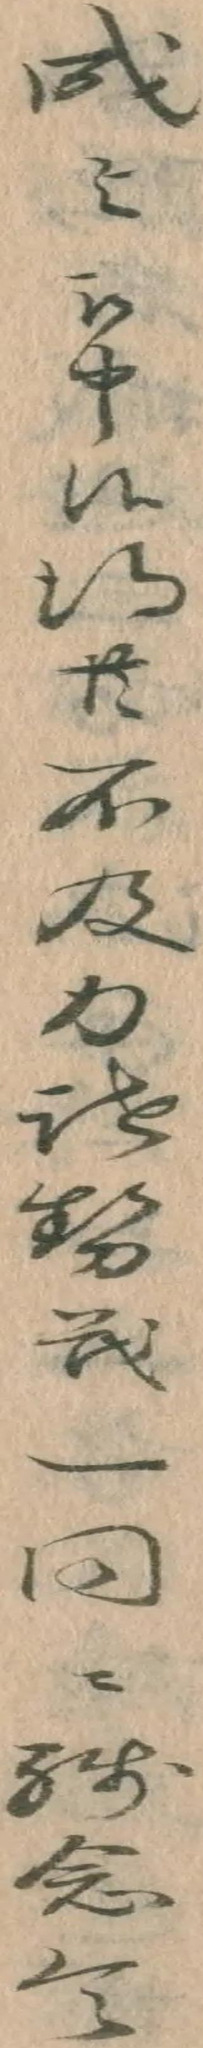成と被申候得共不及力諸勢も一同に残念令
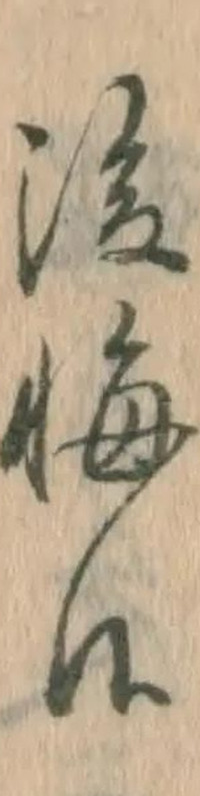後悔候
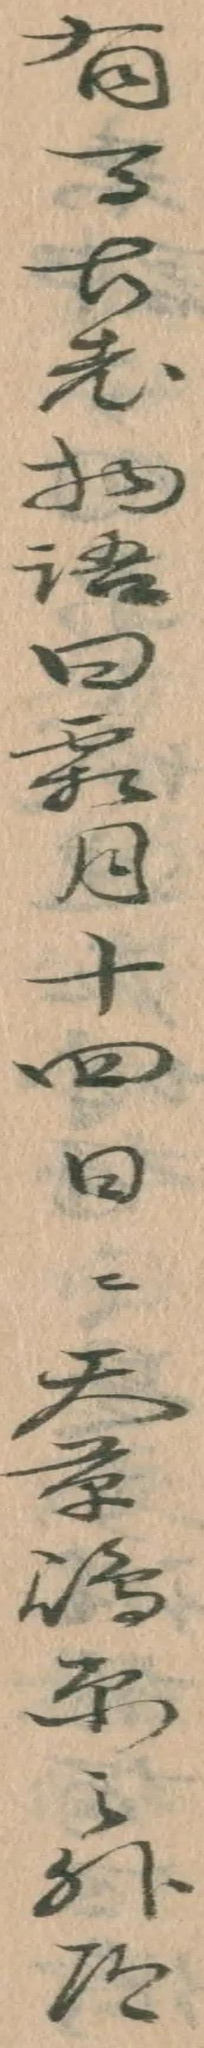有馬古老物語曰霜月十四日に天草島原之外道
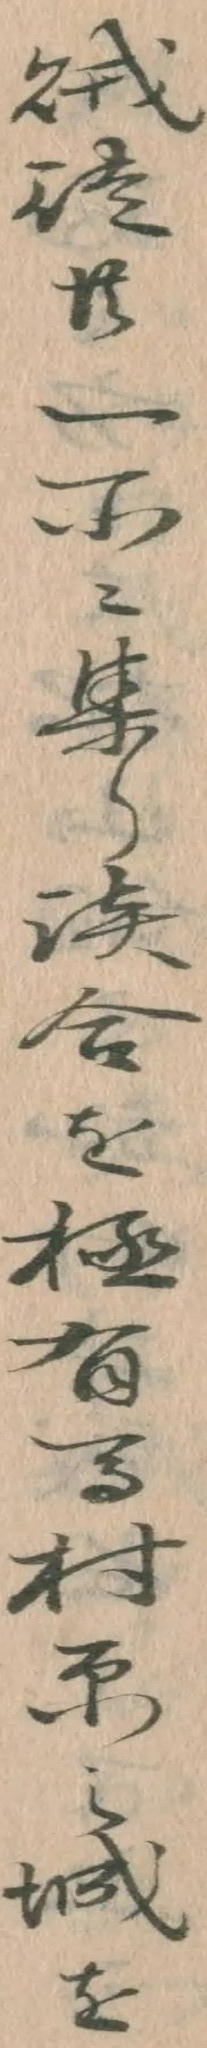賊徒共一所に集り談合を極有馬村原之城を
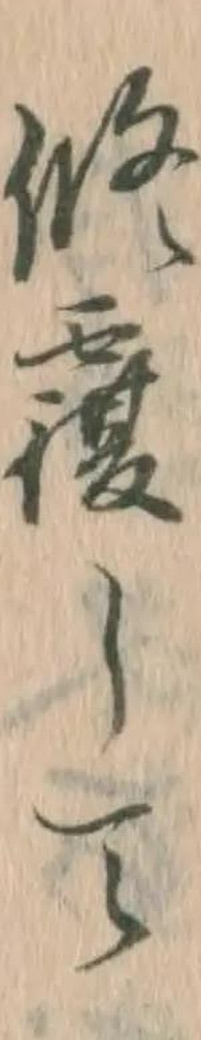修覆して
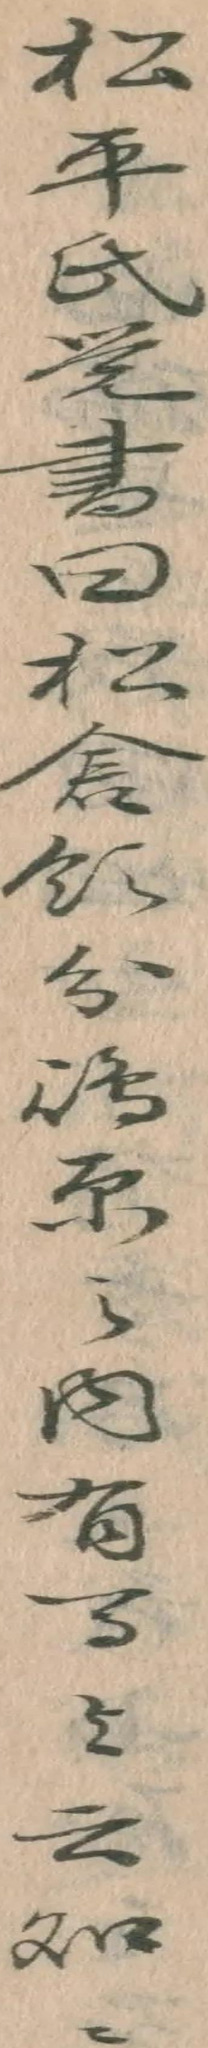松平氏覚書曰松倉領分島原之内有馬と云処に
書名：切支丹御退治記 49巻. [3]
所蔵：国立国会図書館 National Diet Library, JAPAN
